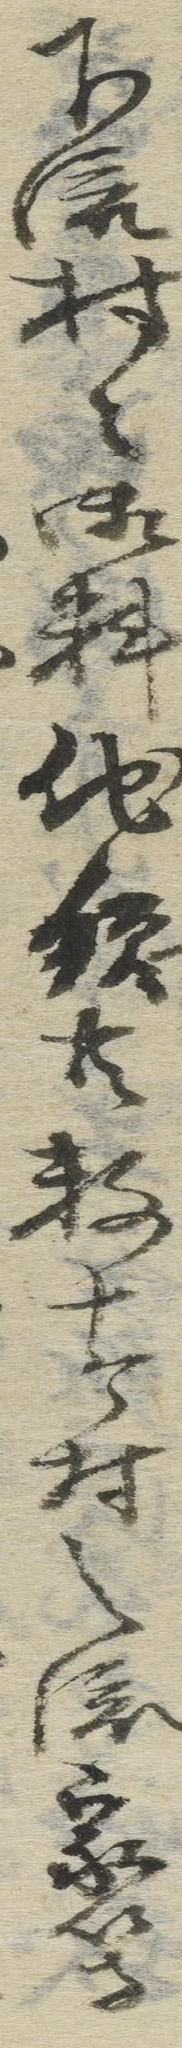下流村々御領他領共数十ヶ村之流家等
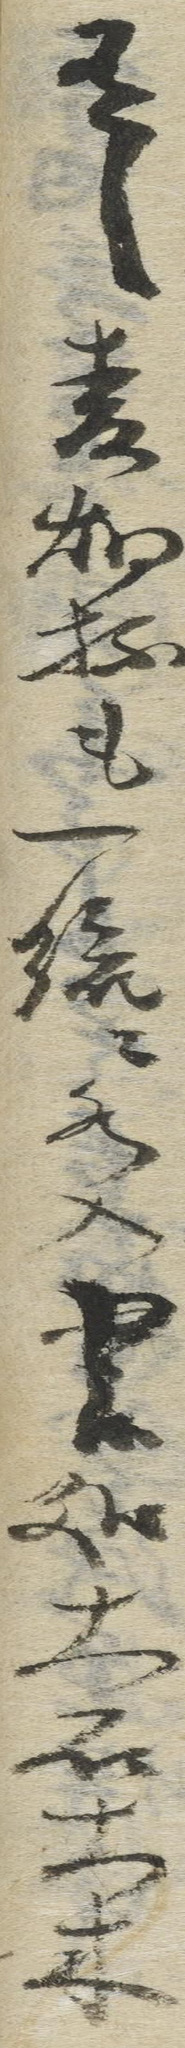有之麦畑抔も一統二水入申候処大石大木
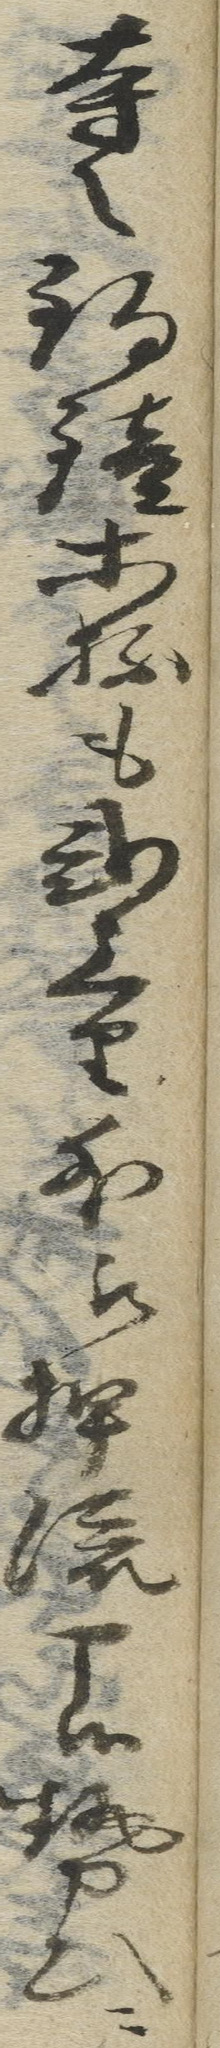寺之釣鐘等抔も弐三里外江押流申候勢ひ二
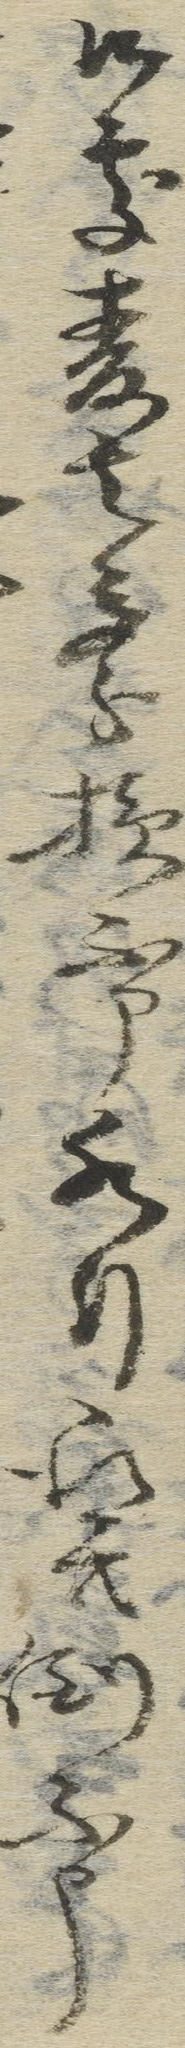候処麦は多分損不申水引候得共倒不申
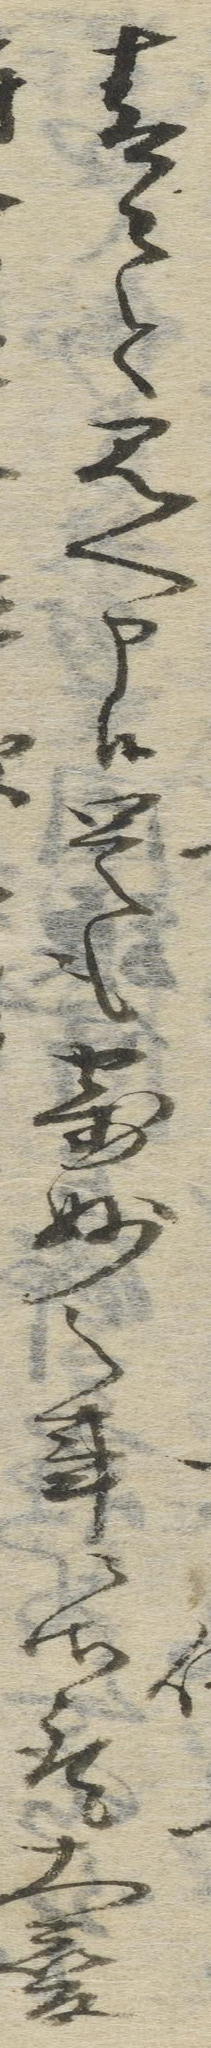十分二と見へ申候是も奇妙之事二御座候大変
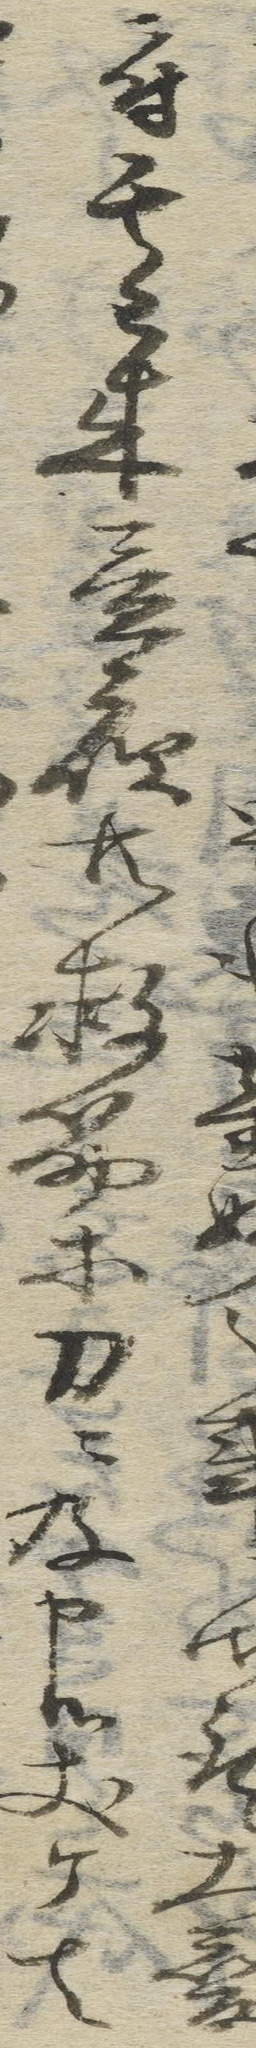二付其已來昼夜共救筋等刀二及申候丈ヶは
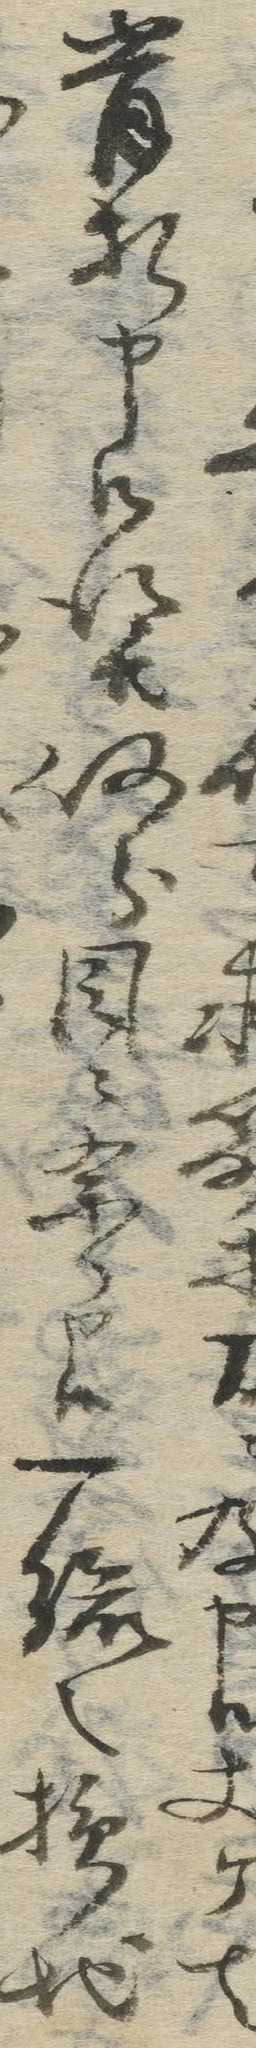骨折申候得共何分目二余り申候一統之損地
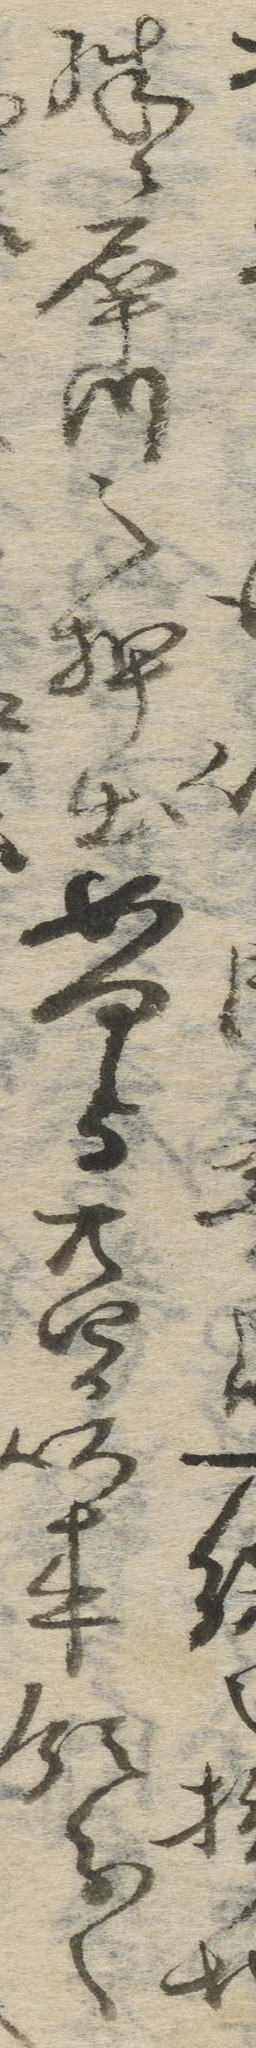殊二犀川之押出如何と廿四日以来領分之
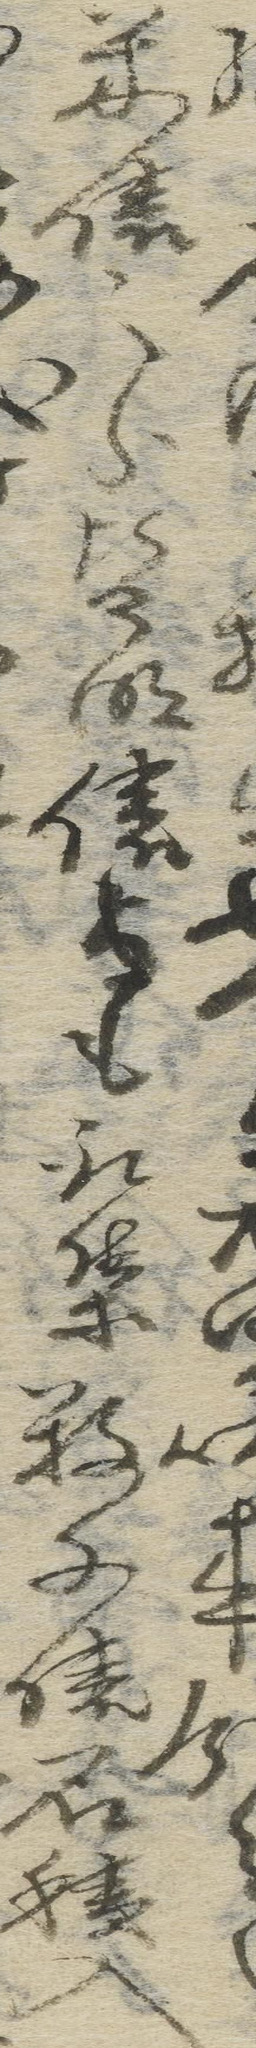米俵之分皆明俵とも取集数千俵石積入
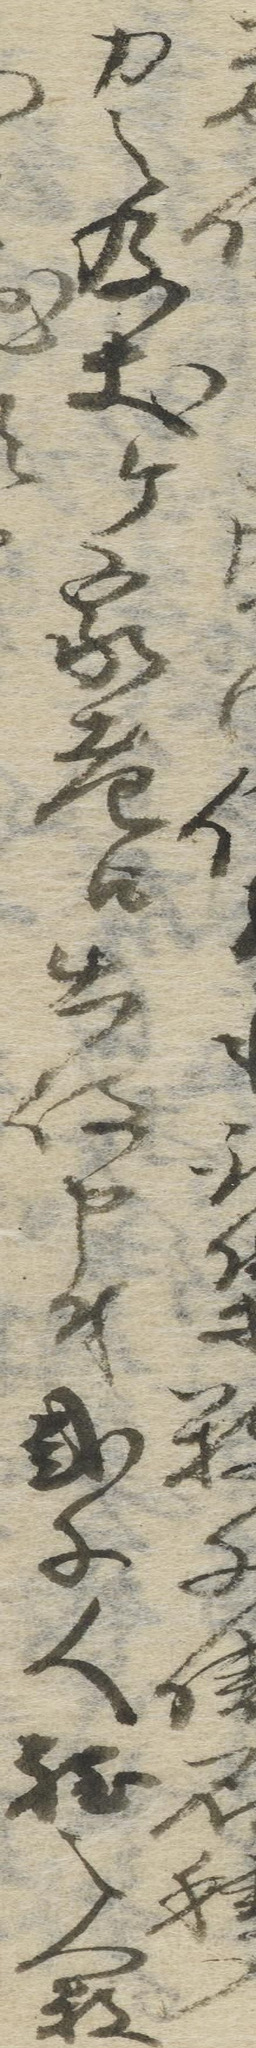力之及丈ヶ家老江出役申付弐千人程之人数
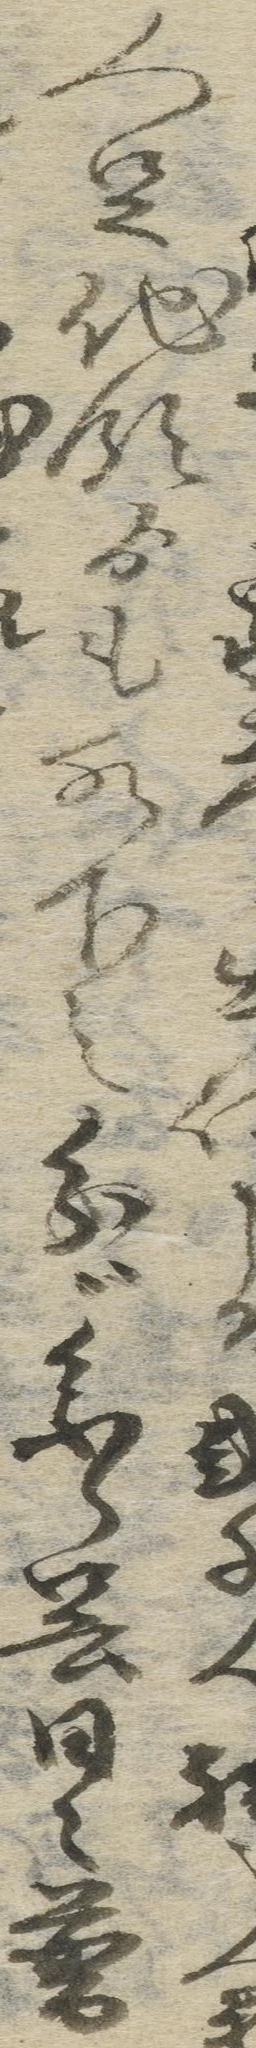人足他領ゟも水下之分ハ参り呉日々普
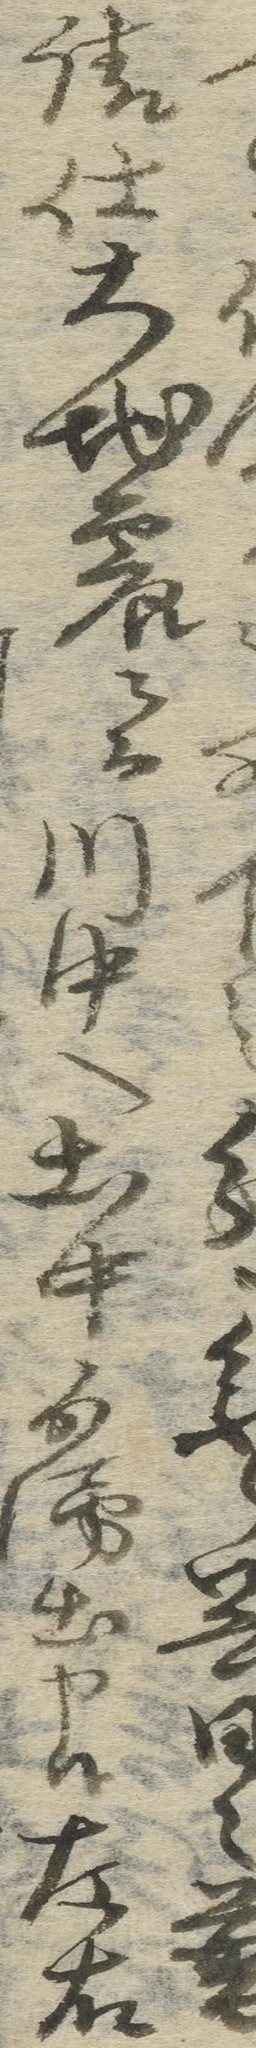請仕大地震二而川中へ土中ゟ涌出申候左右
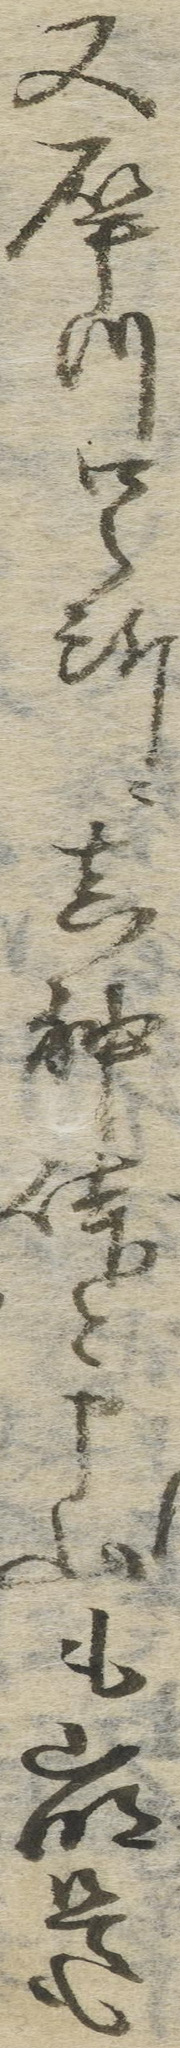又犀川口之所二真神峠と申山も崩是も
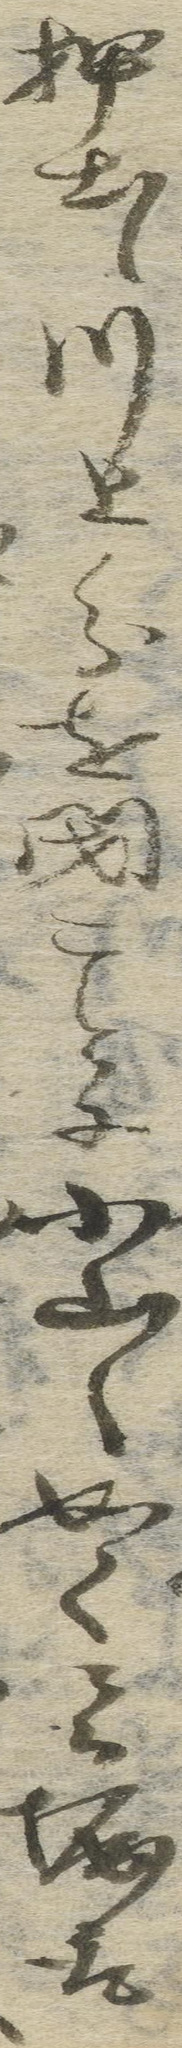押出し川上分を閉ことに小山之如く二而堀取
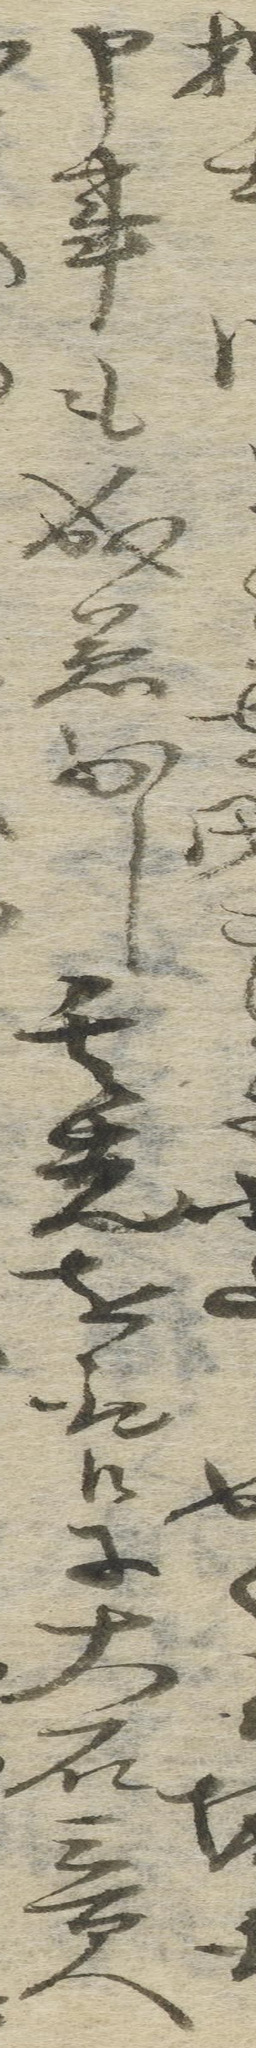申事も成兼少し其先を取候に大石三百人
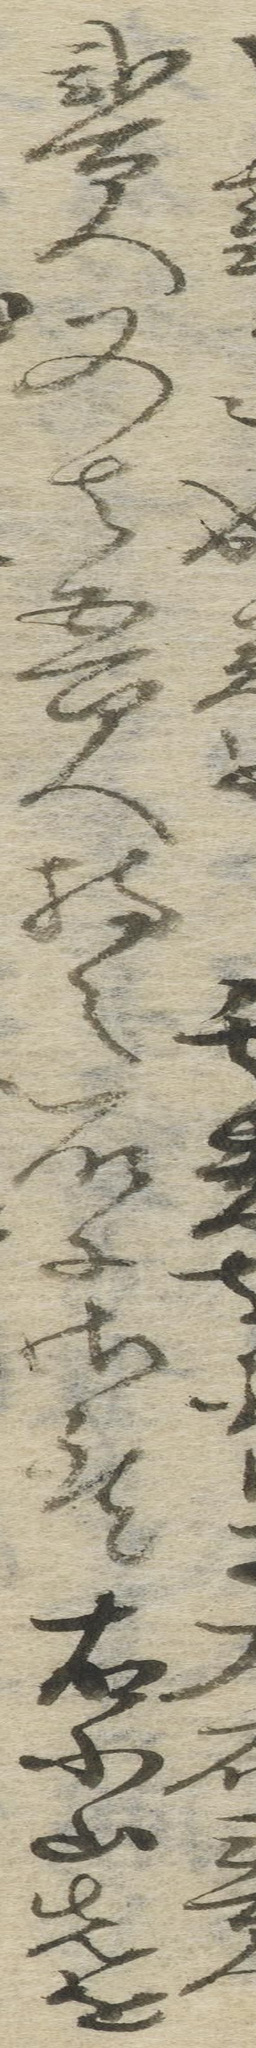弐百人又は五百人持之石二御座候右小山先を
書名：信濃越後　地震書留
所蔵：東京大学地震研究所図書室 Earthquake Research Institute Library, The University of Tokyo, JAPAN
